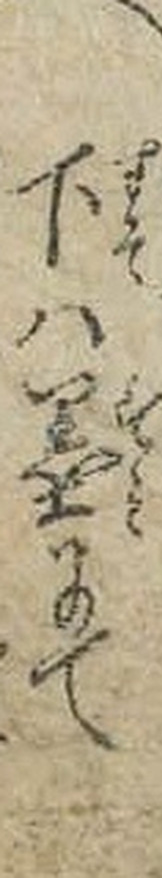下は墨にて
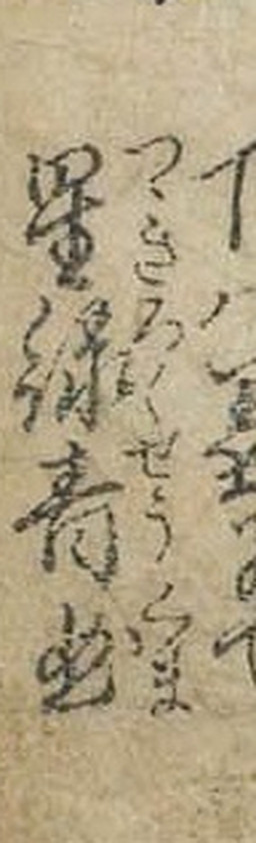星緑青曲

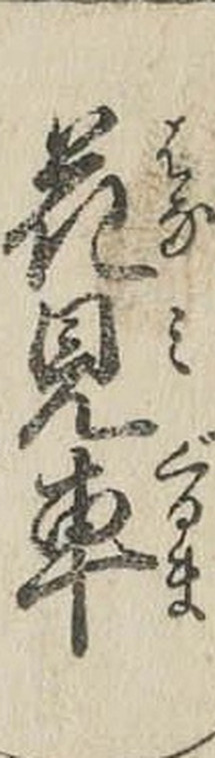花見車

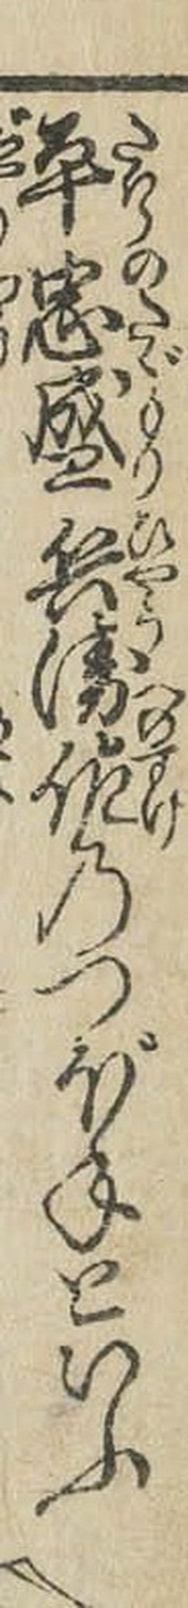平忠盛兵衛佐のつぼねといふ
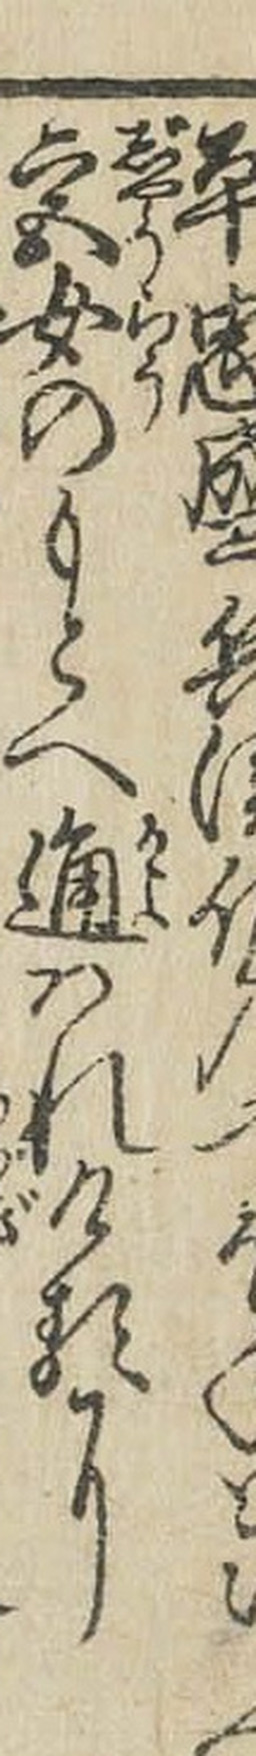宮女のもとへ通はれけるに
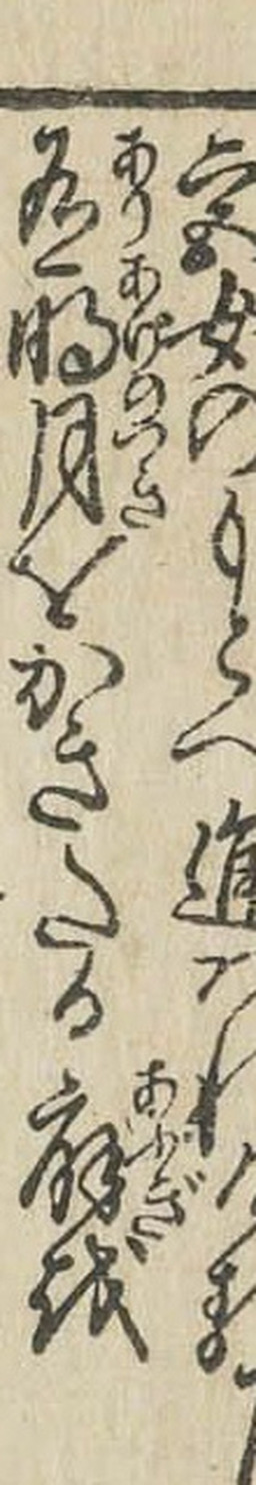有明月をかきたる扇を
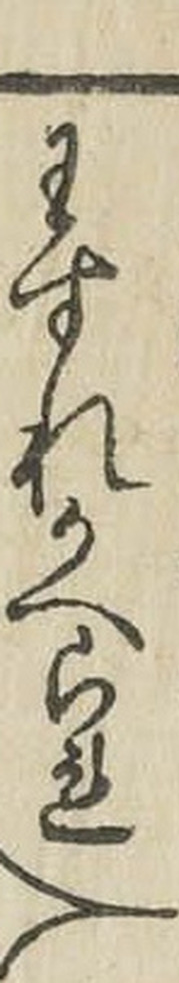わすれかへられ
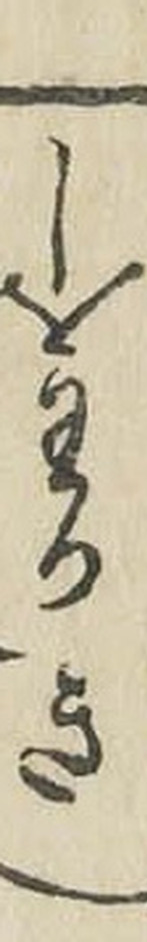しをわかき
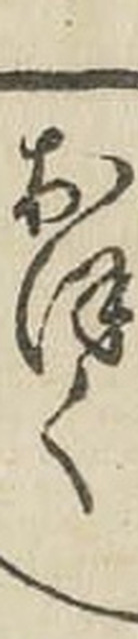おほく
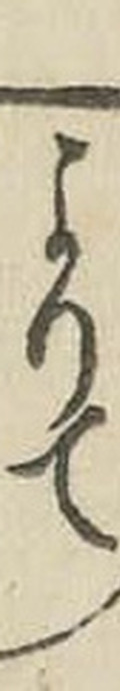よりて
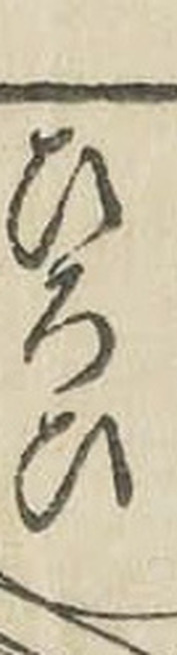ひろひ
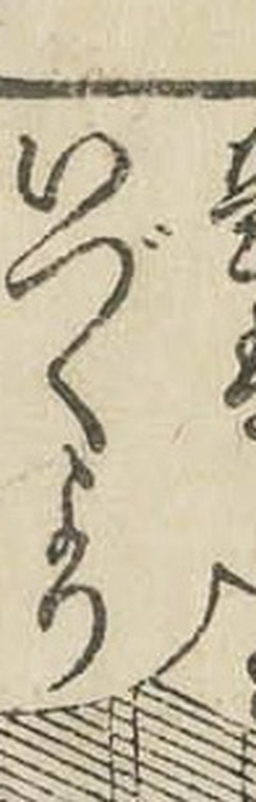いづくより
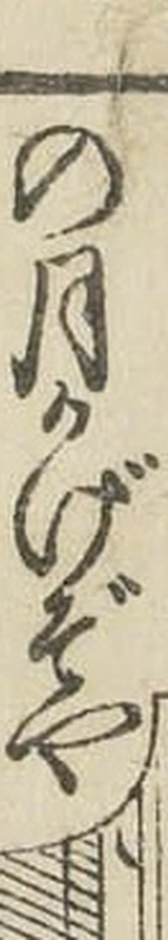の月かげぞや
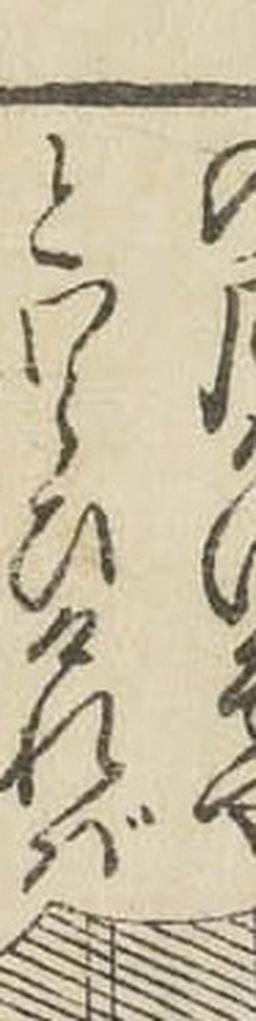とわらひければ
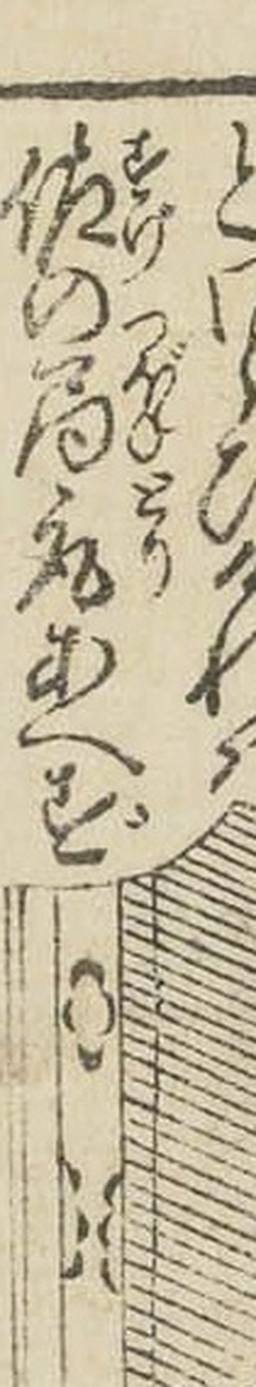佐の局取あへず
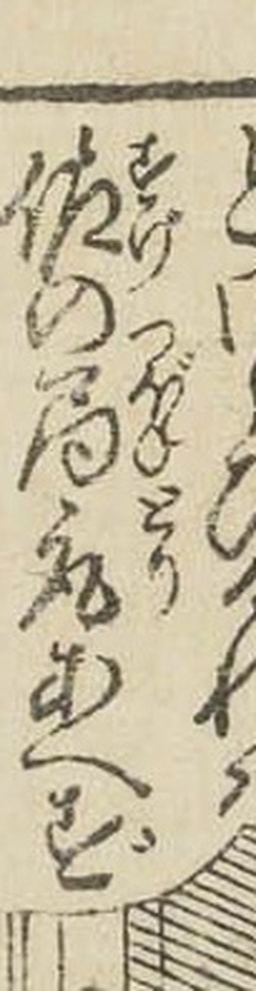佐の局取あへず
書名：絵本写宝袋 9巻 1之巻
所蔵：東京学芸大学教育コンテンツアーカイブ
